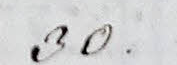30.
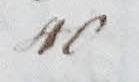40
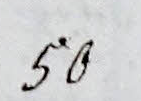50
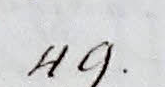49.
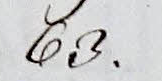63.
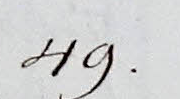49.
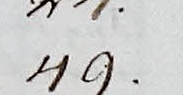49.
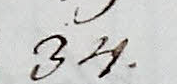34.
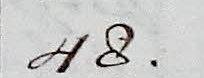48.
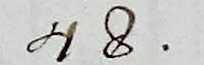48.
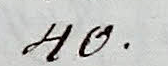40.
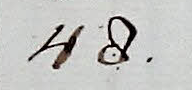48.
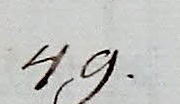49.
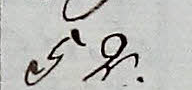52.
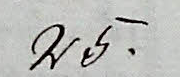25.
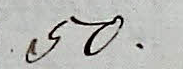50.
